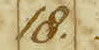18
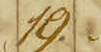19
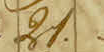21
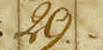29
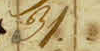31
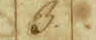3
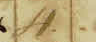4
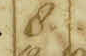8
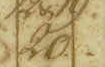20
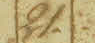21
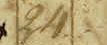24
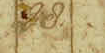28
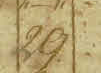29
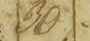30
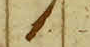1
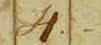4
